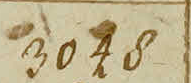3048
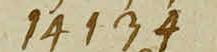14134
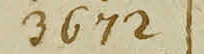3672
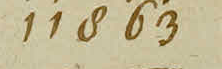11863
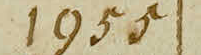1955
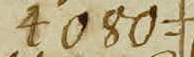4080
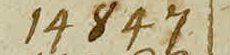14847
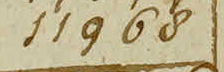11968
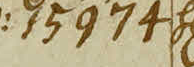15974
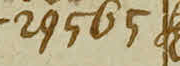29565
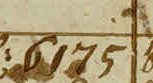6175
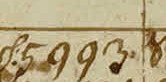5993
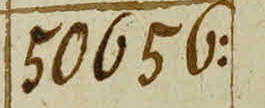50656:
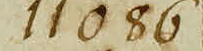11086
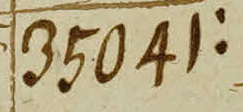35041
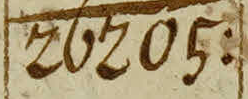26205
